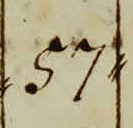57
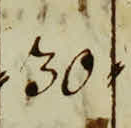30
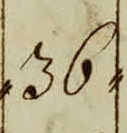36
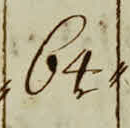64
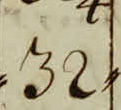32
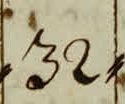32
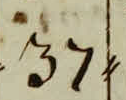37
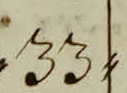33
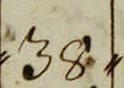38
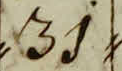31
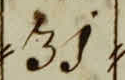31
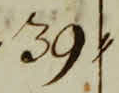39
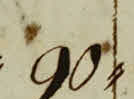90
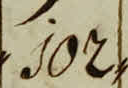102
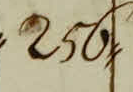256
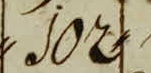102
